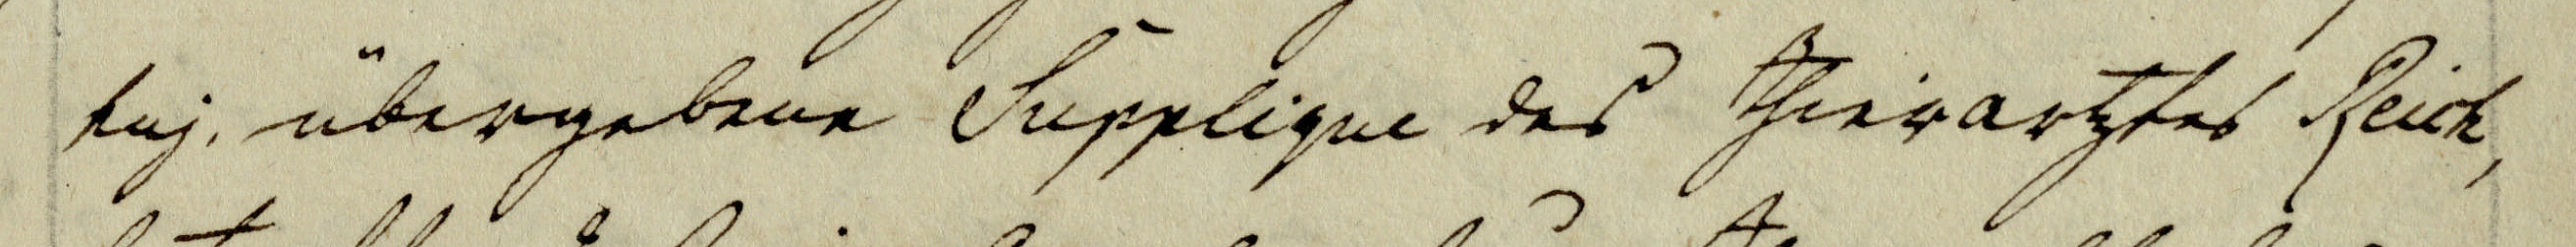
huj. übergebene Supplique des Thierartztes Reich,
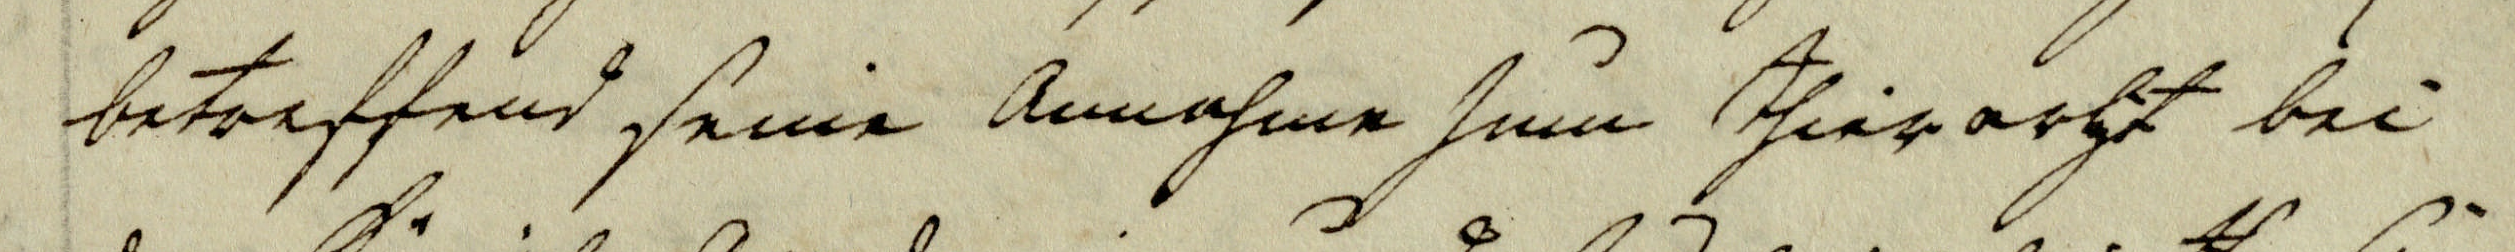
betreffend seine Annahme zum Thierartzt bei
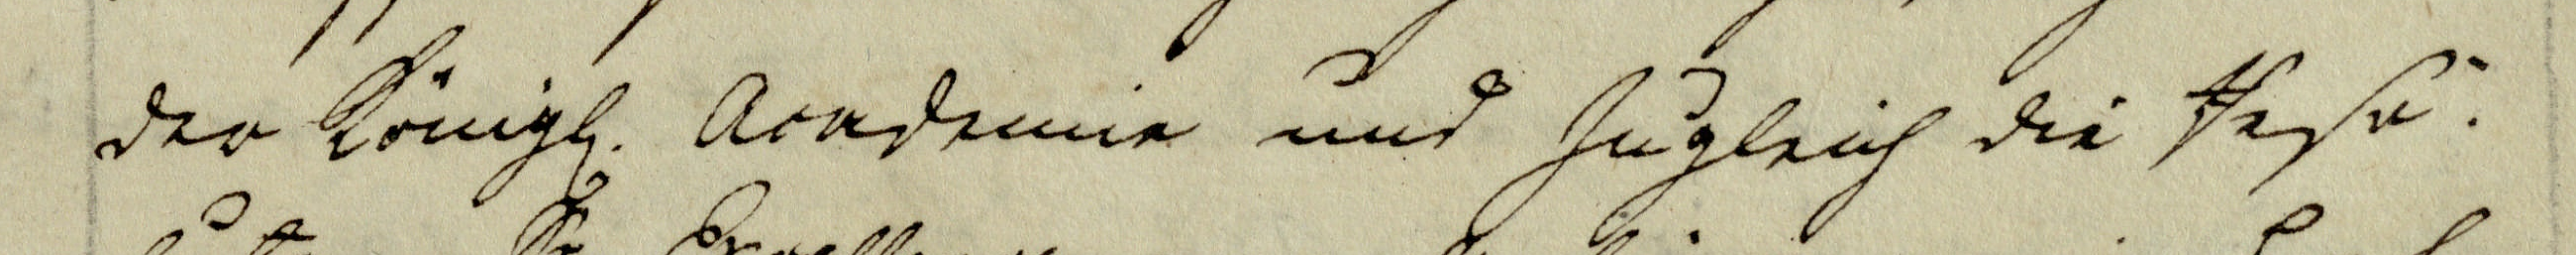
der Königl. Academie und zugleich die Reso¬
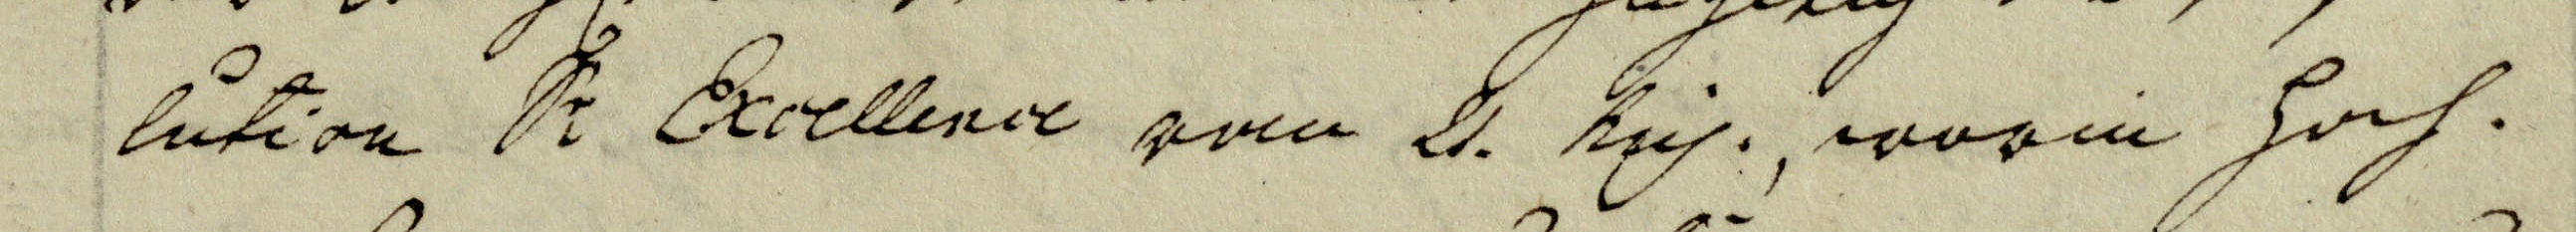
lution Sr Excellence vom 21. huj., worin Hoch¬
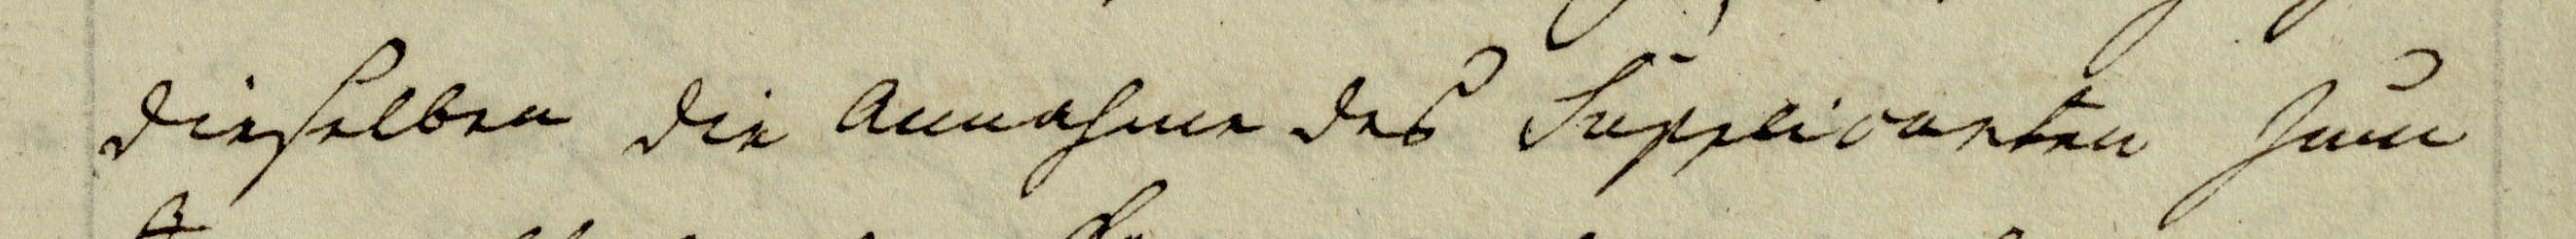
dieselben die Annahme des Supplicanten zum
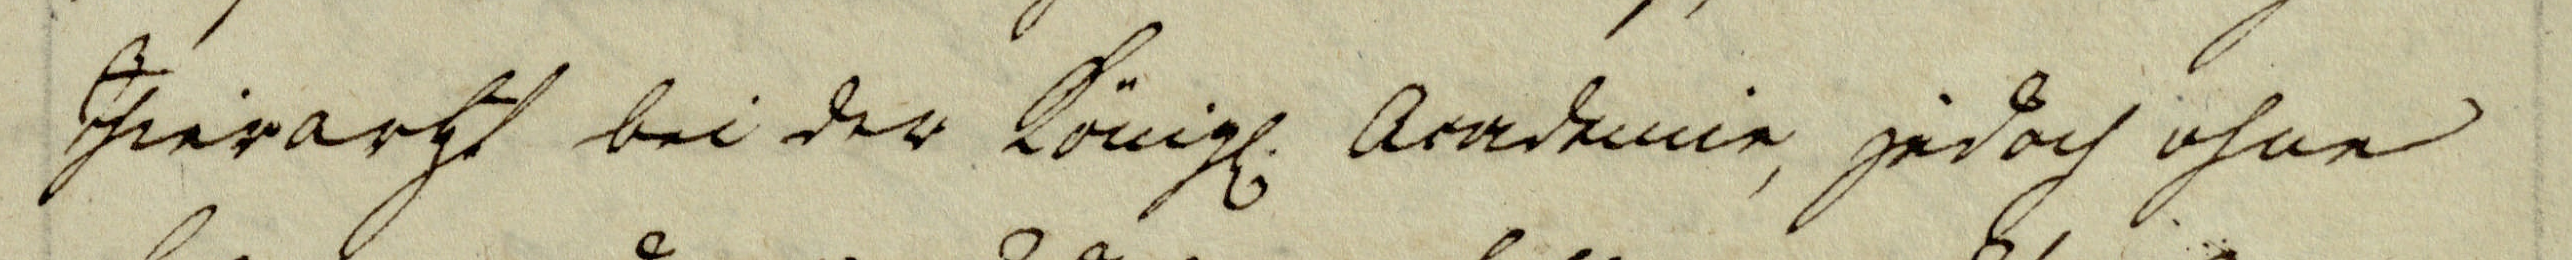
Thierartzt bei der Königl. Academie, jedoch ohne
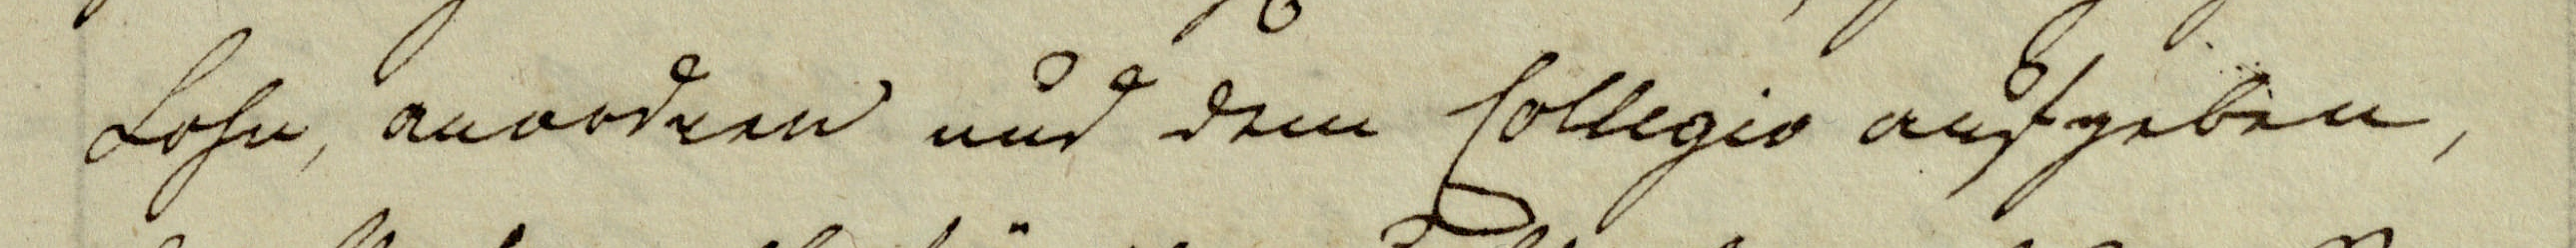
Lohn, anordnen und dem Collegio aufgeben,
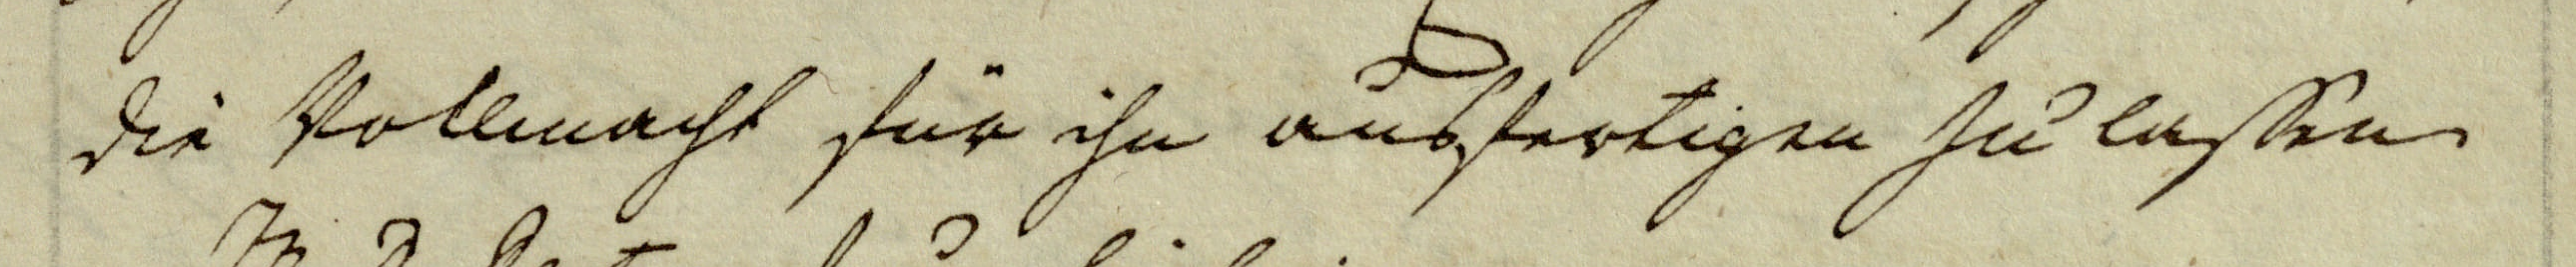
die Vollmacht für ihn ausfertigen zu lassen.
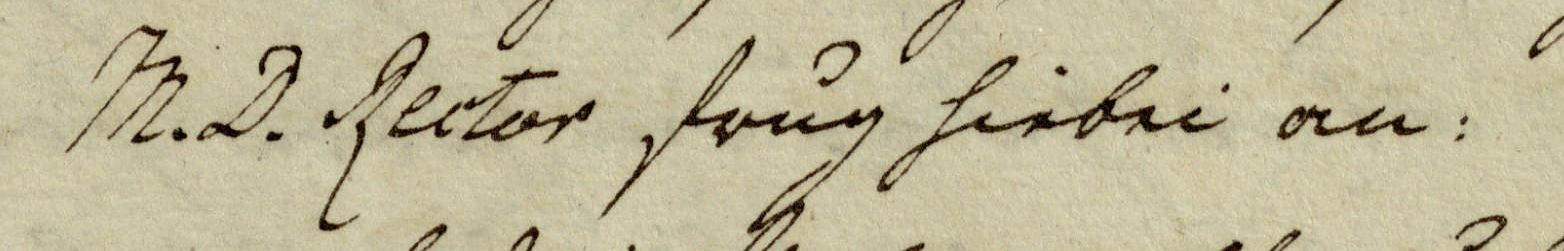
M. D. Rector frug hiebei an:
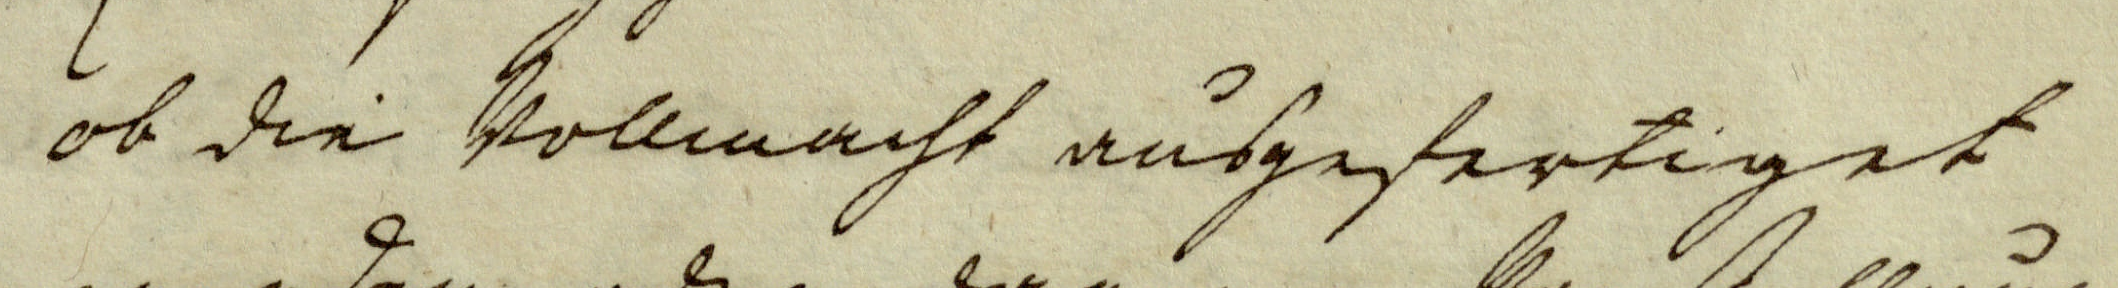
ob die Vollmacht ausgefertiget
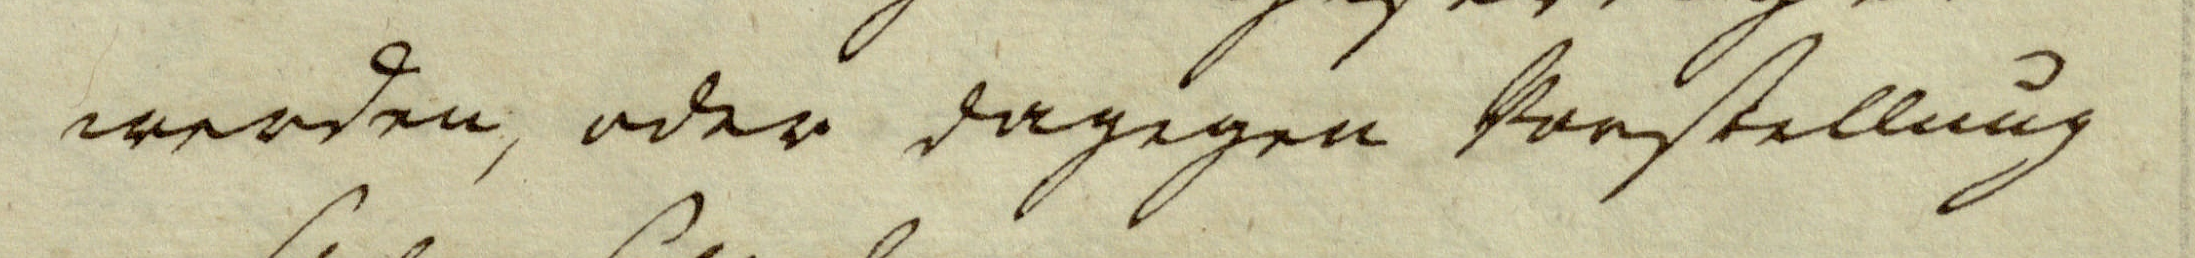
werden, oder dagegen Vorstellung
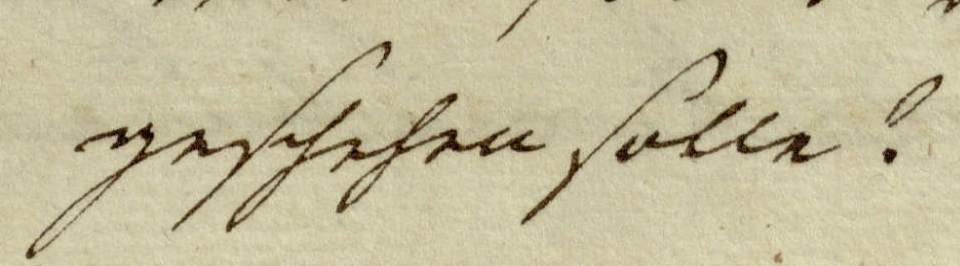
geschehen solle?
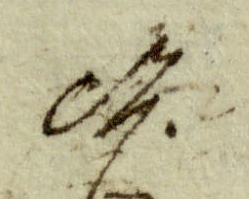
dh.
